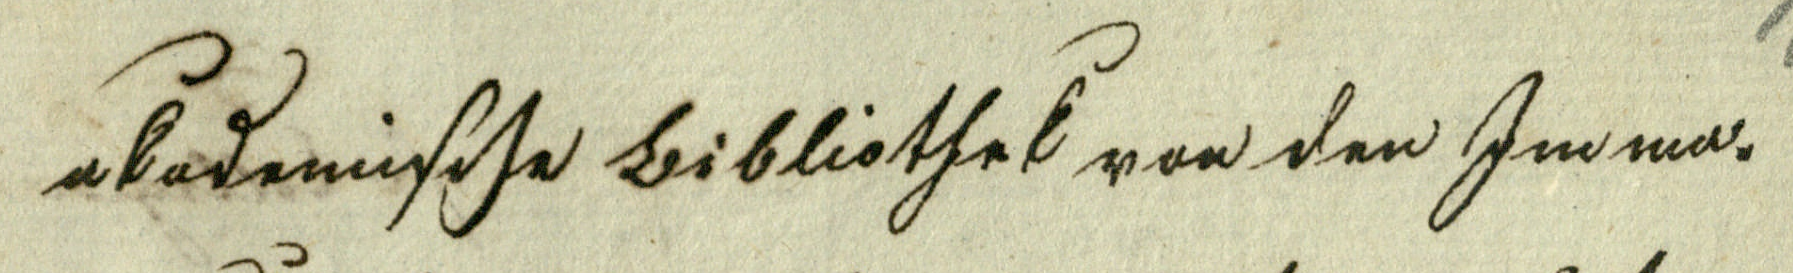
akademische Bibliothek von den Imma¬
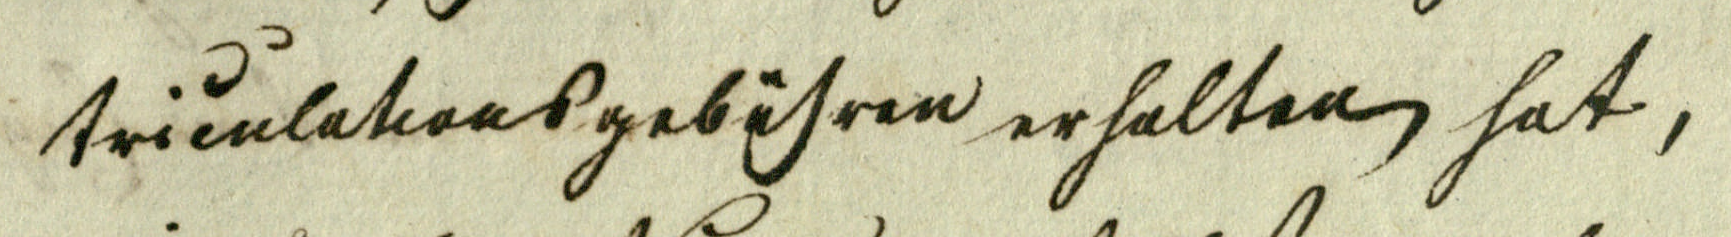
triculationsgebühren erhalten hat,
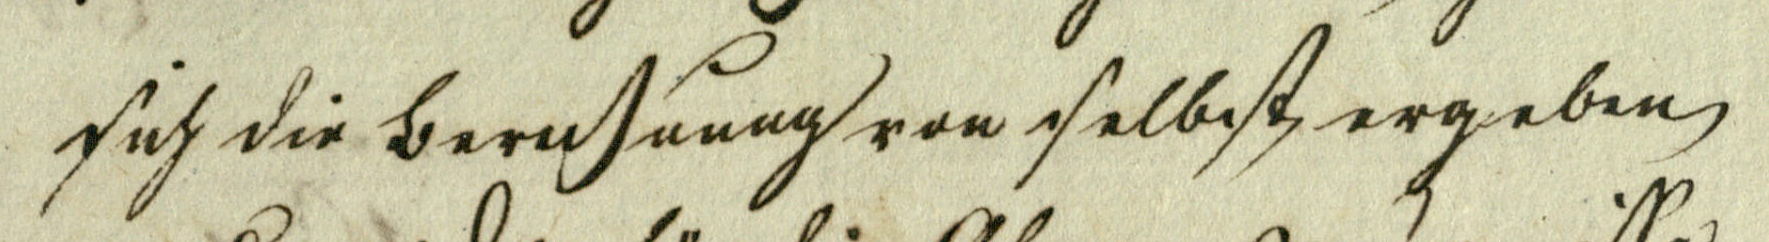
sich die Berechnung von selbst ergeben
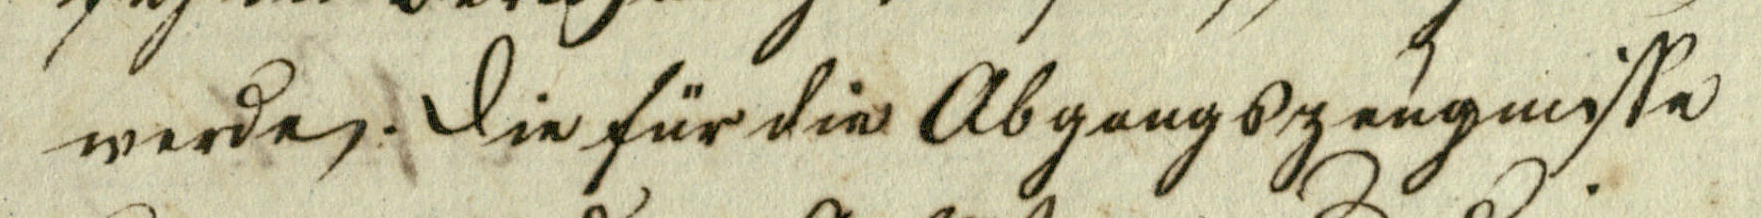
werde. Die für die Abgangszeugnisse
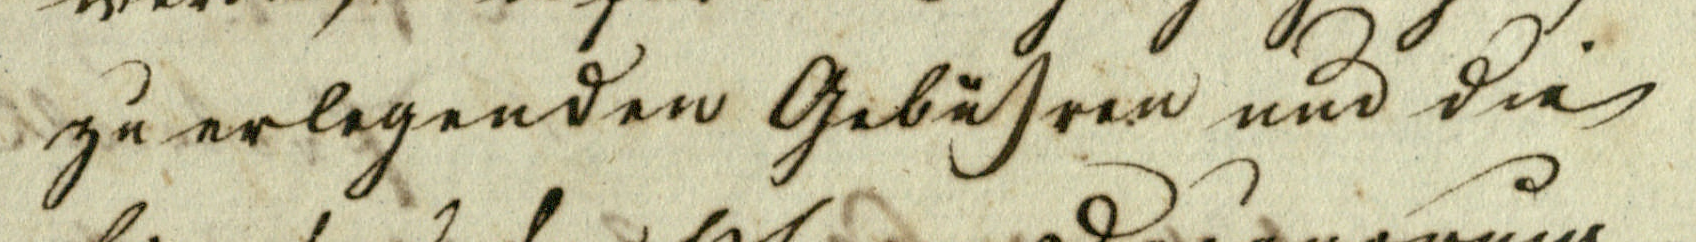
zu erlegenden Gebühren und die
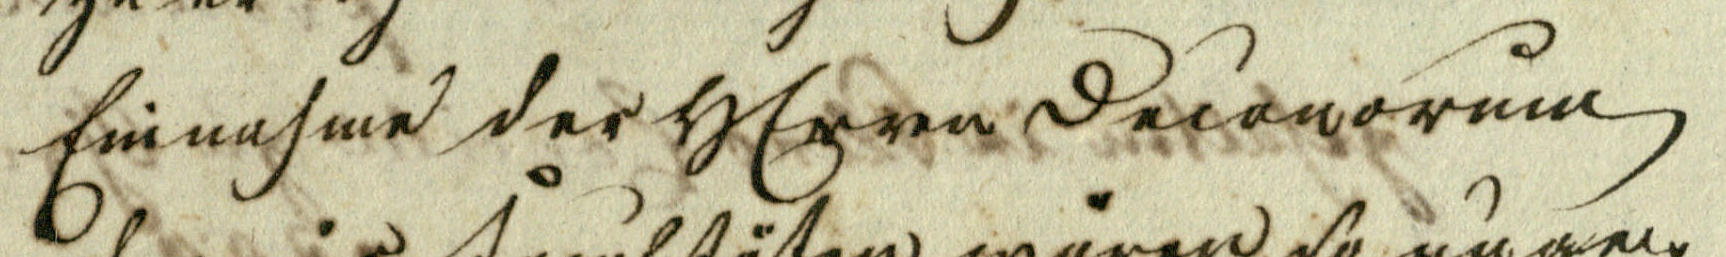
Einnahme der Herren Decanorum
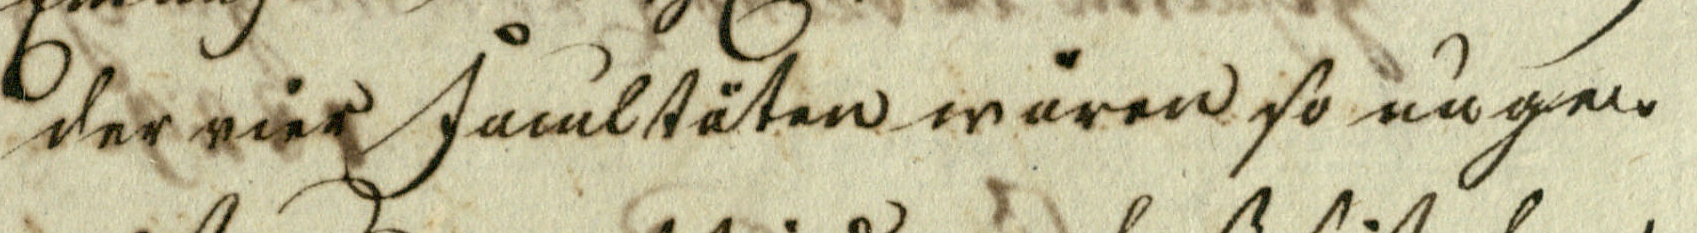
der vier Facultäten wären so unge¬
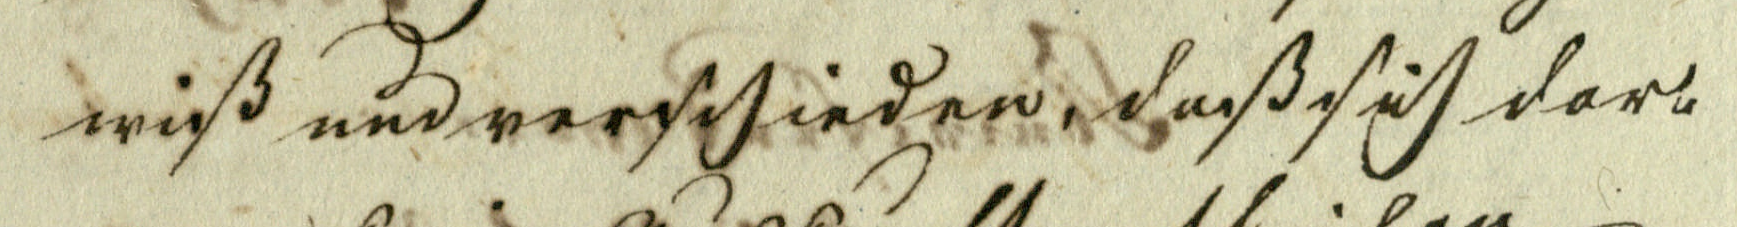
wiß und verschieden, daß sich dar¬
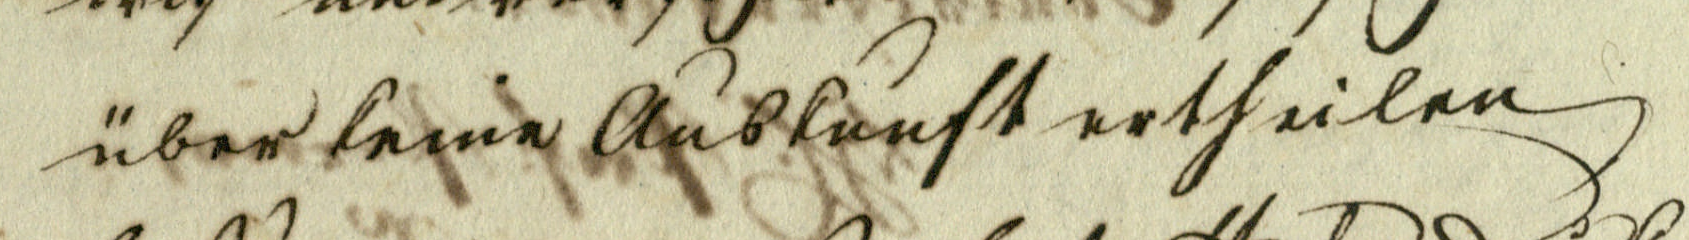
über keine Auskunft ertheilen
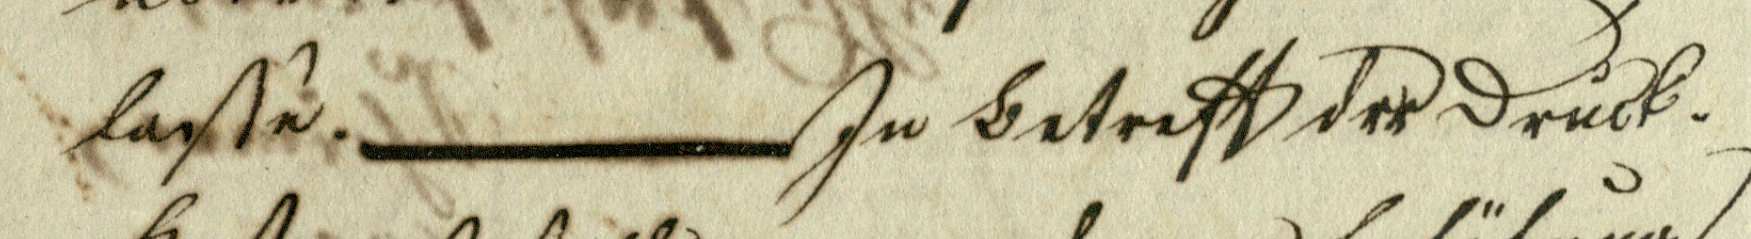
lasse. In Betreff zu Druck¬
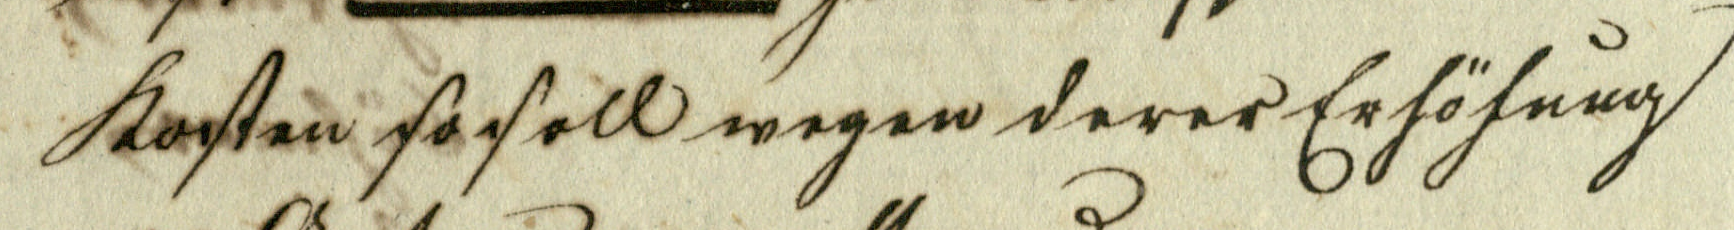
Kosten so soll wegen derer Erhöhung
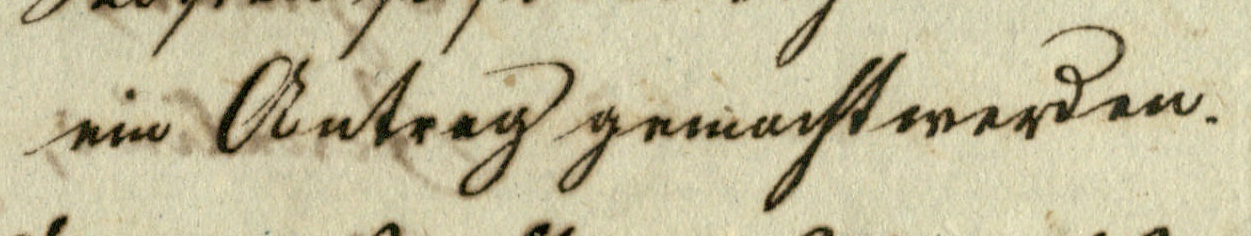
ein Antrag gemacht werden.
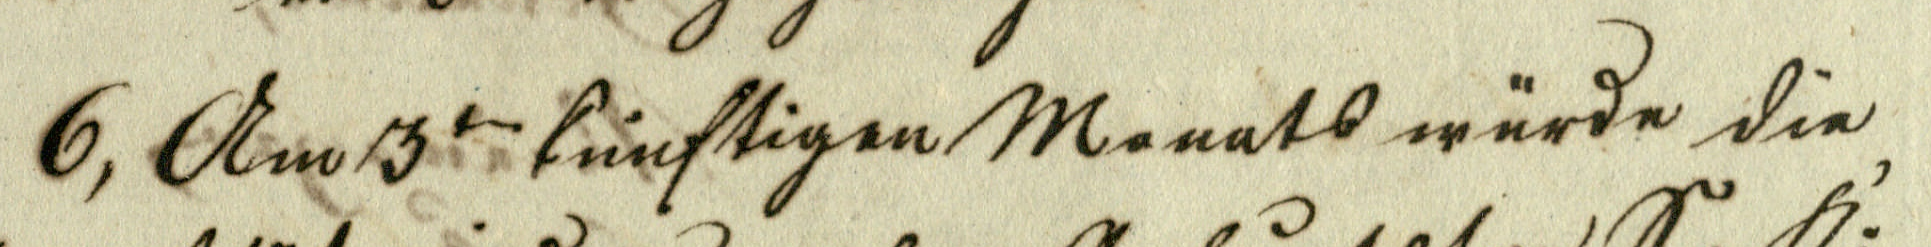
6, Am 3 ten künftigen Monaths würde die
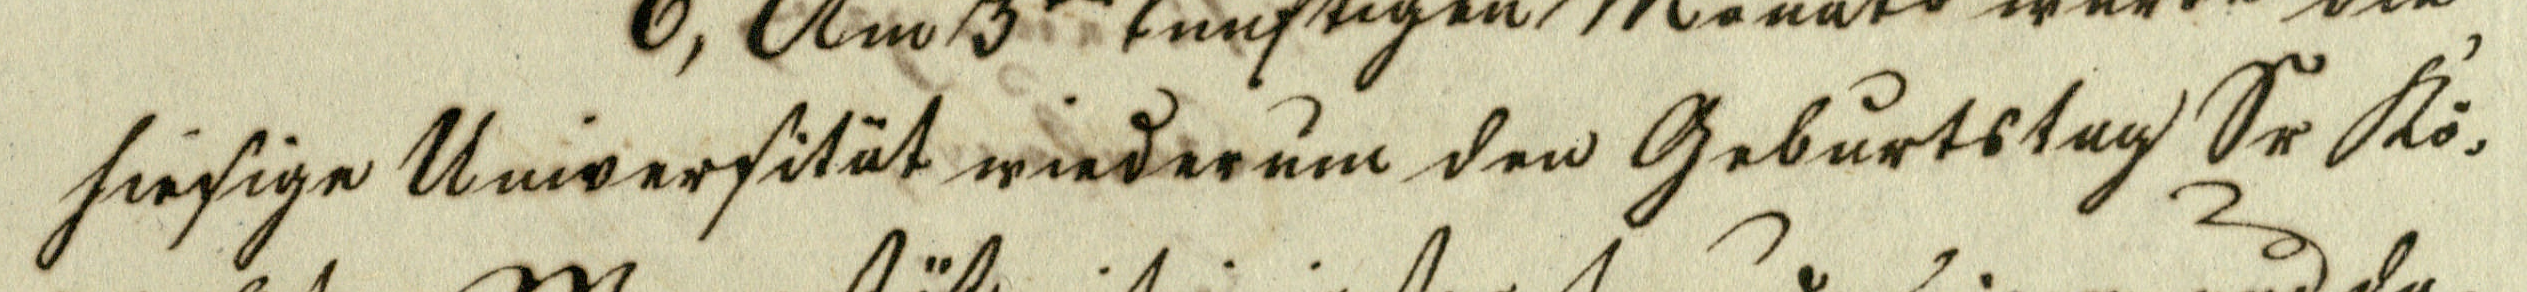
hiesige Universität wiederum den Geburtsag Sr Kö¬
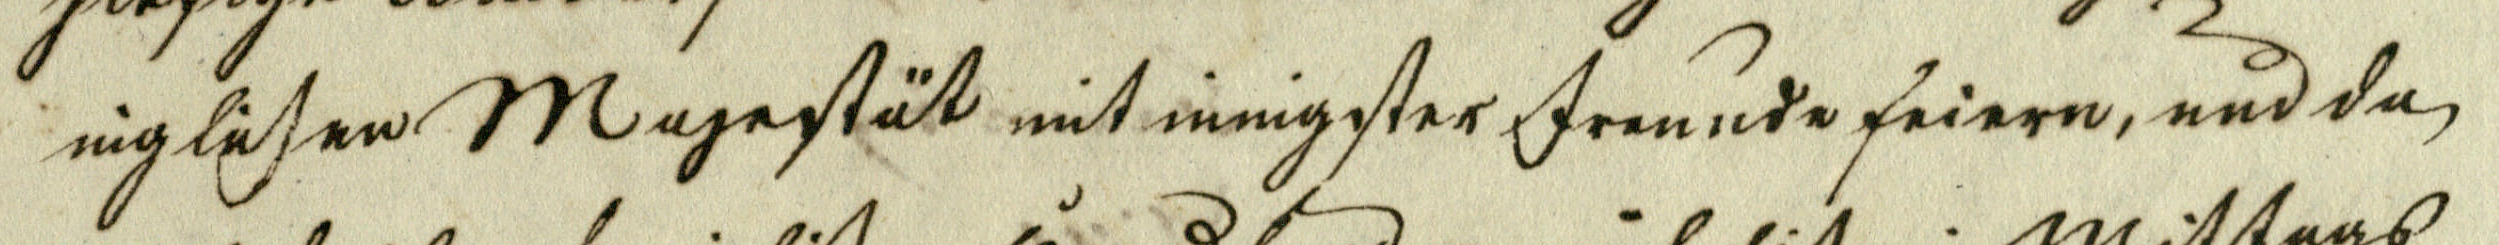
niglichen Majestät mit innigster Freunde feiern, und da
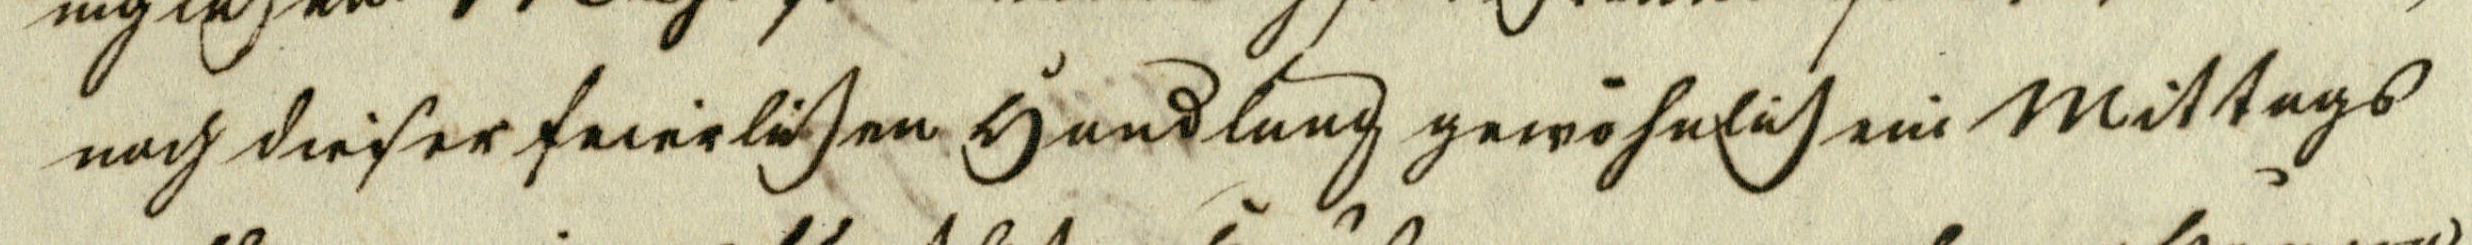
nach dieser feierlichen Handlung gewöhnlich ein Mittags
